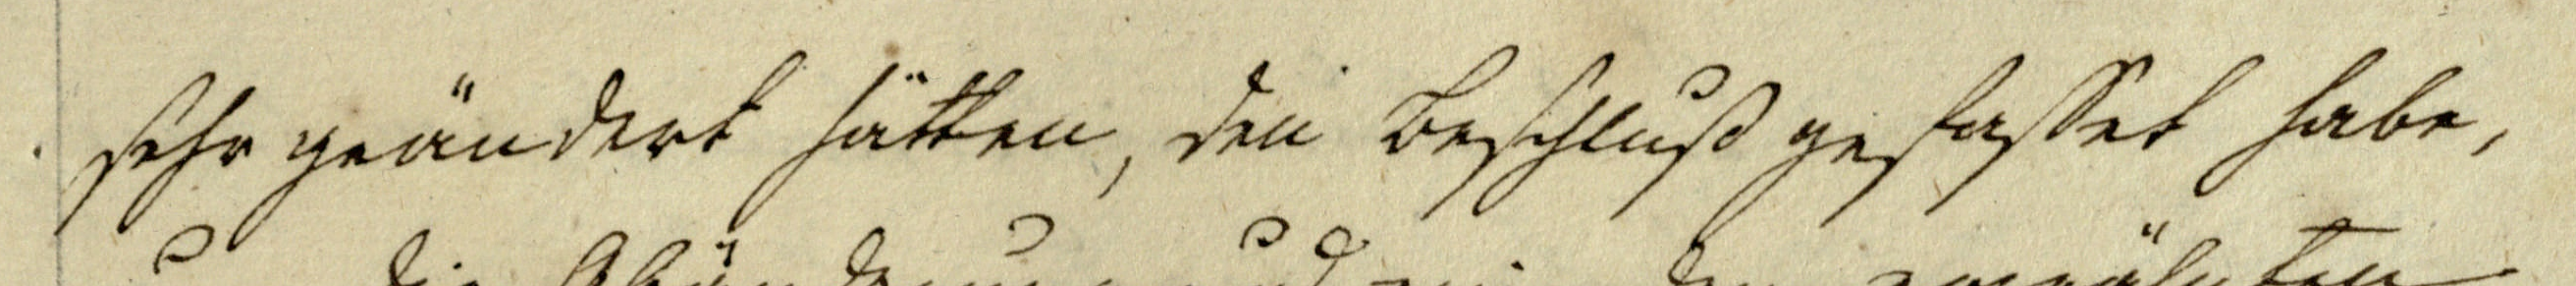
sehr geändert hätten, den Beschluß gefasset habe,
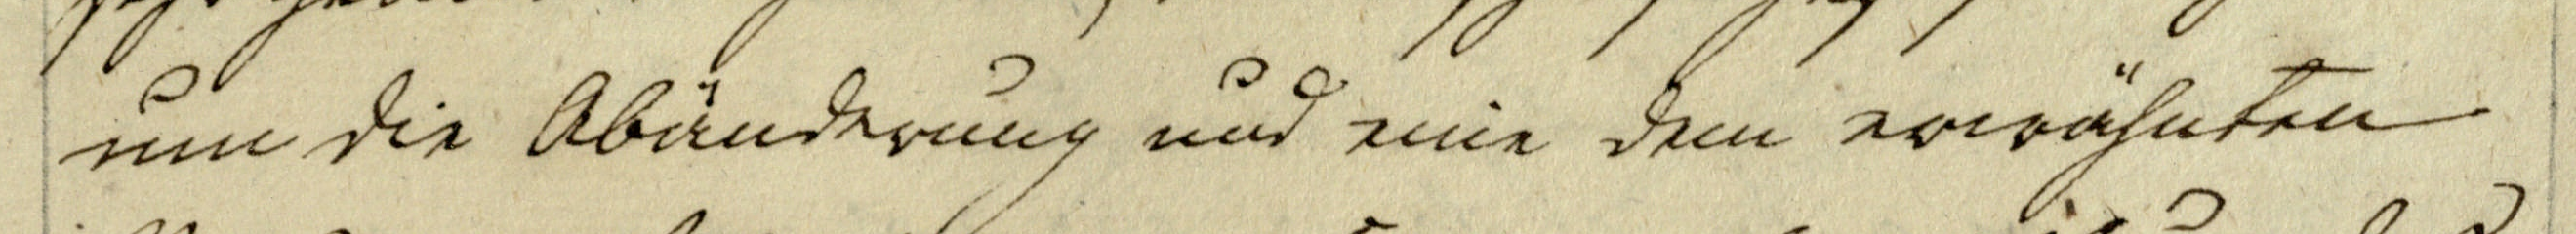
nun die Abänderung und eine dem erwähnten
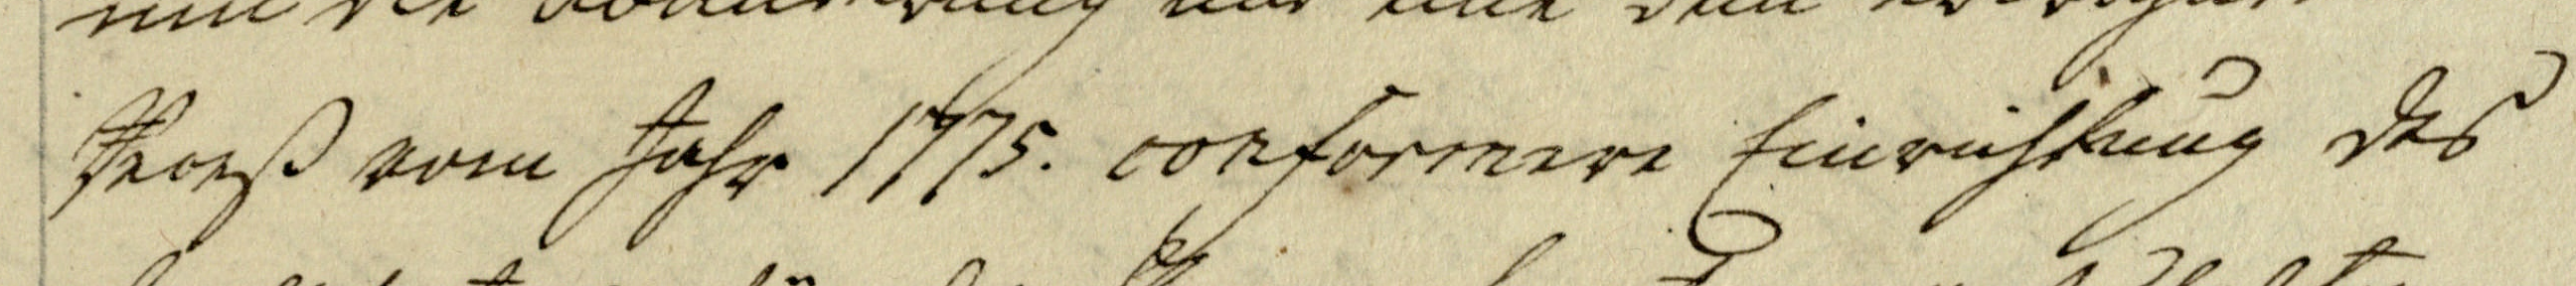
Receß vom Jahr 1775. conformere Einrichtung des
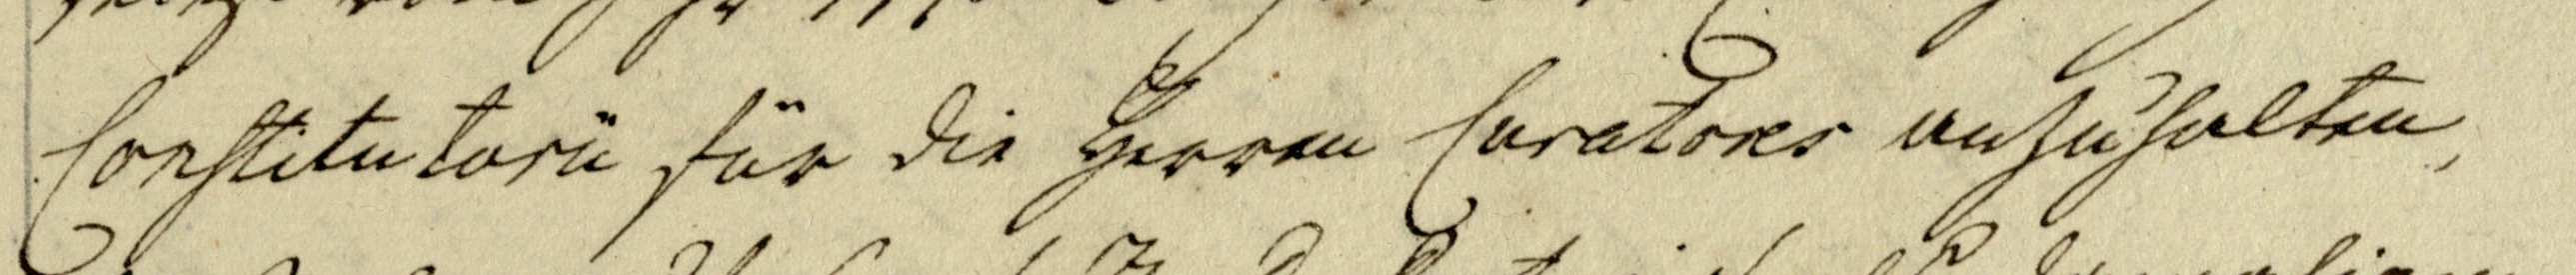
Constitutorii für die Herren Curatores anzuhalten,
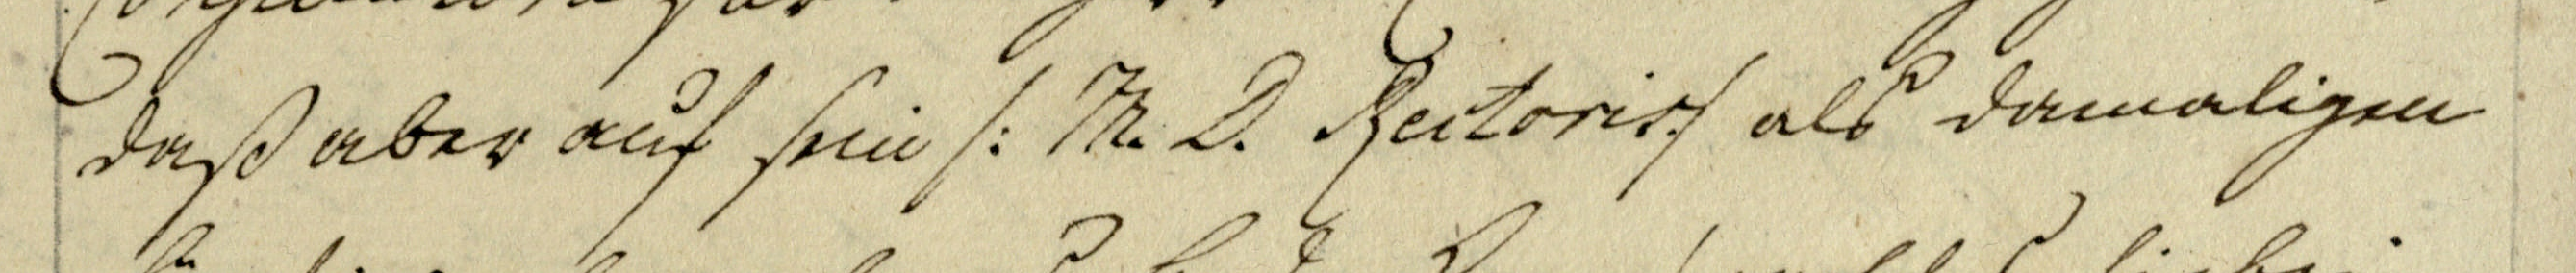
daß aber auf sein /: M. D. Rectoris :/ als damaligen
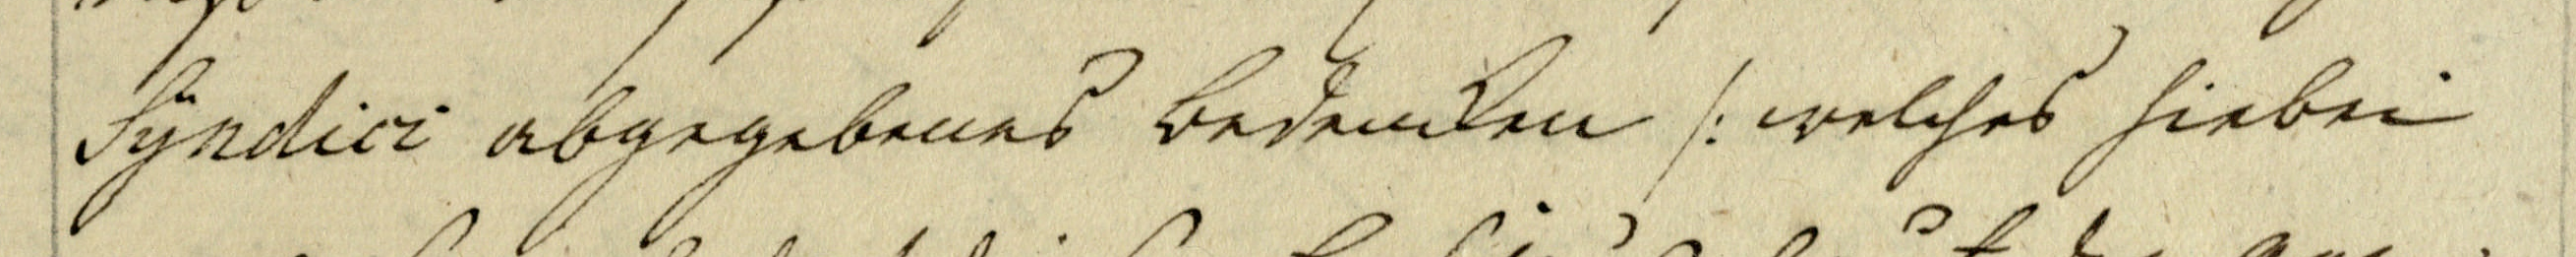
Sÿndici abgegebenes Bedenken /: welches hiebei
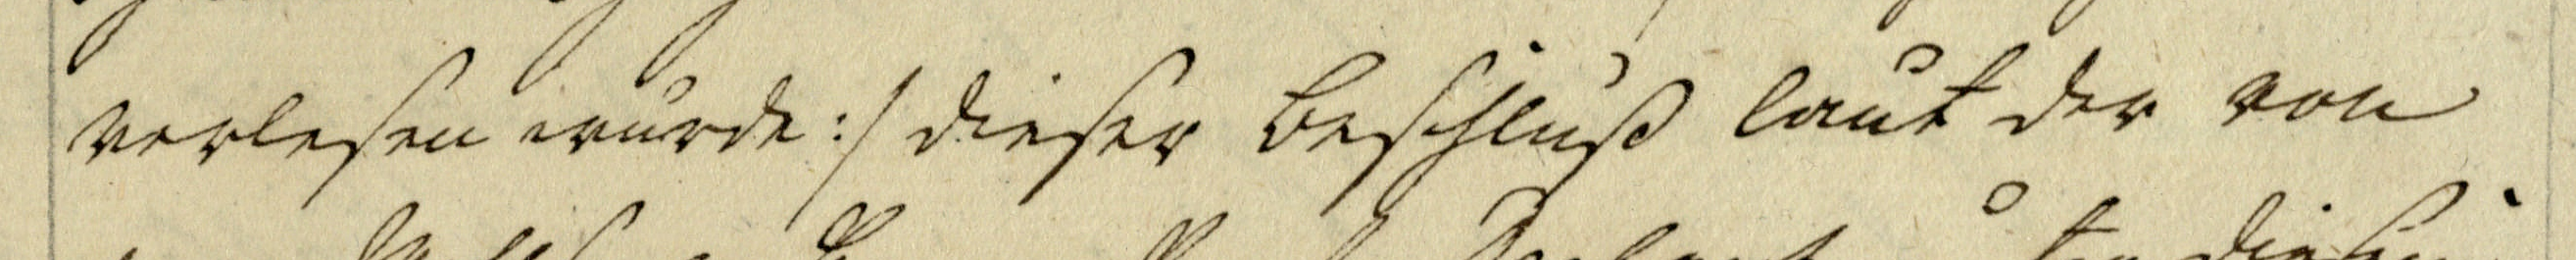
verlesen wurde :/ dieser Beschluß laut der von
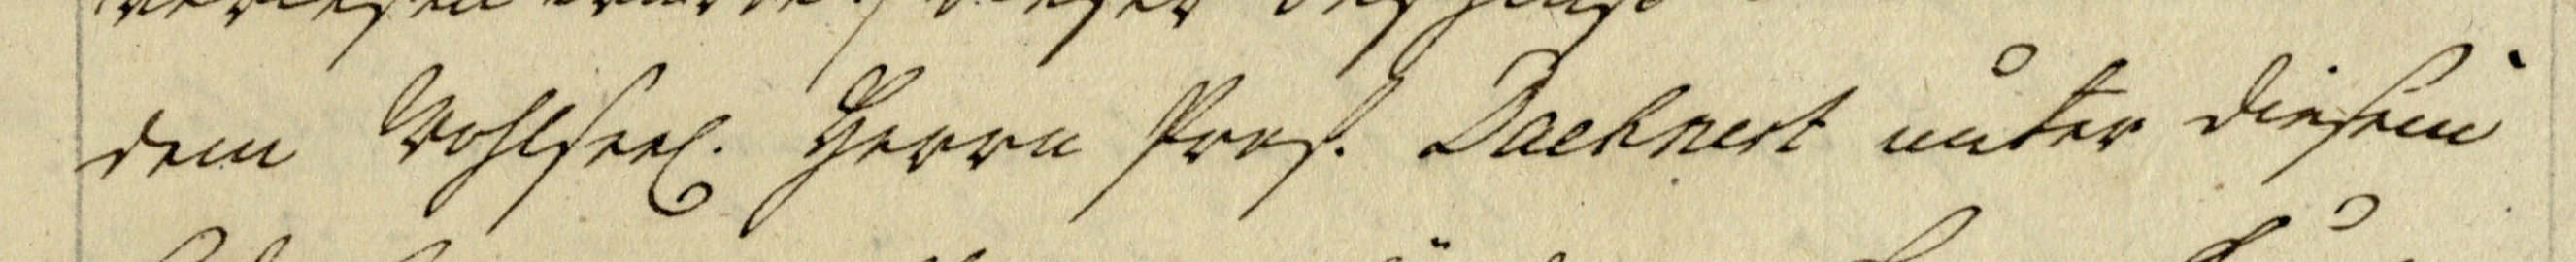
dem Wohlseel. Herrn Prof. Daehnert unter diesem
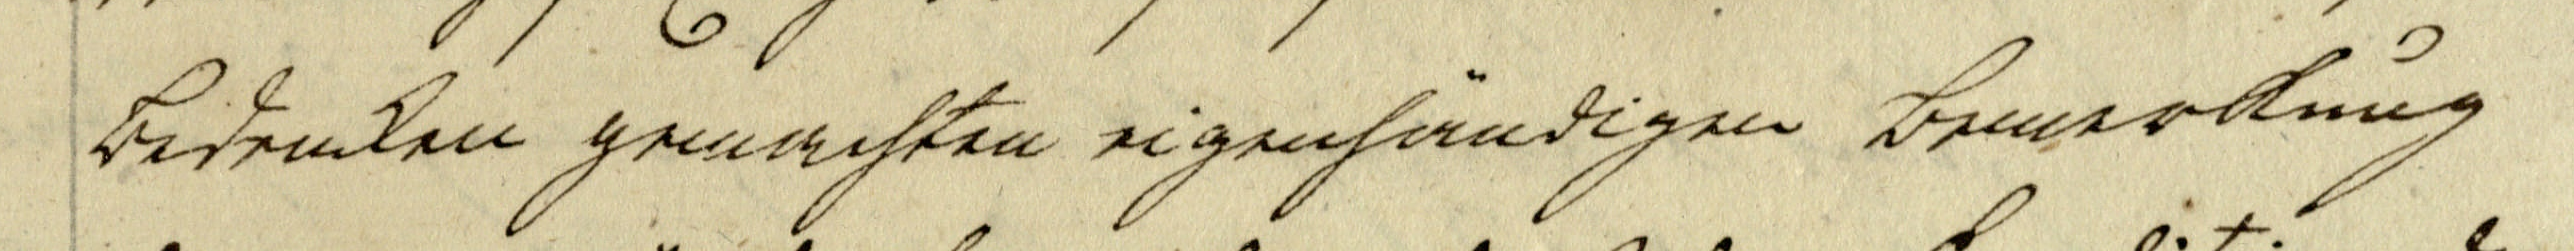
Bedenken gemachten eigenhändigen Bemerkung
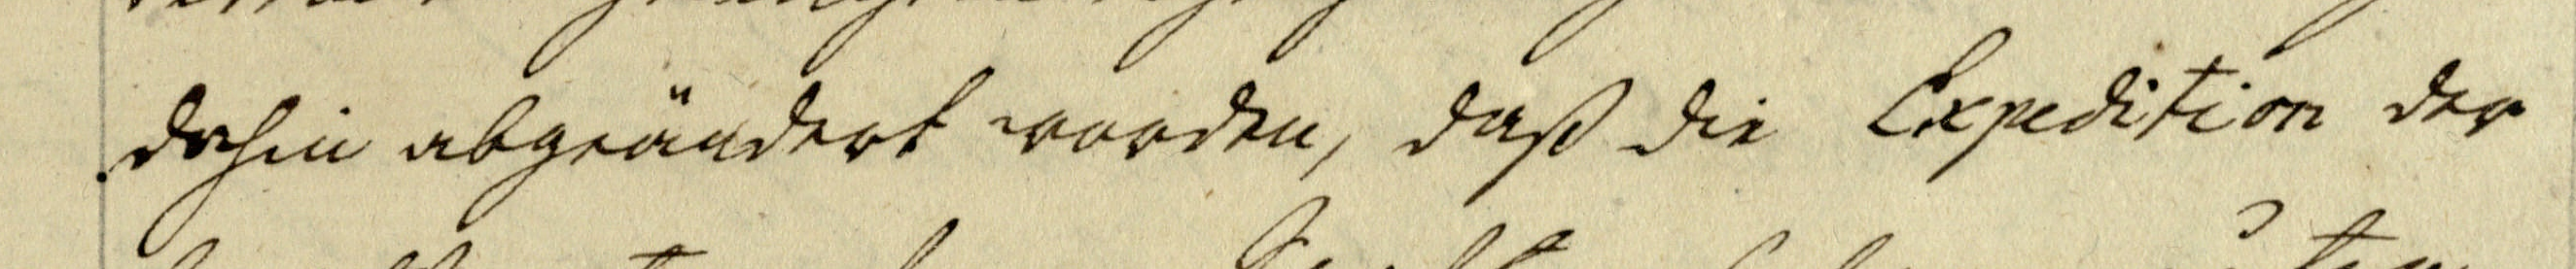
dahin abgeändert worden, daß die Expedition der
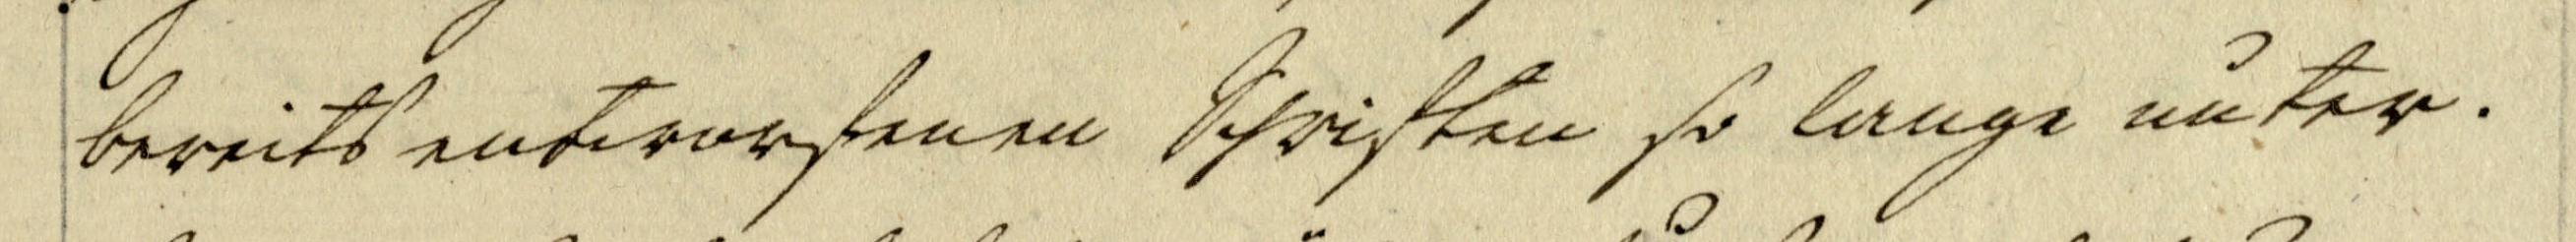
bereits entworfenen Schriften so lange unter¬
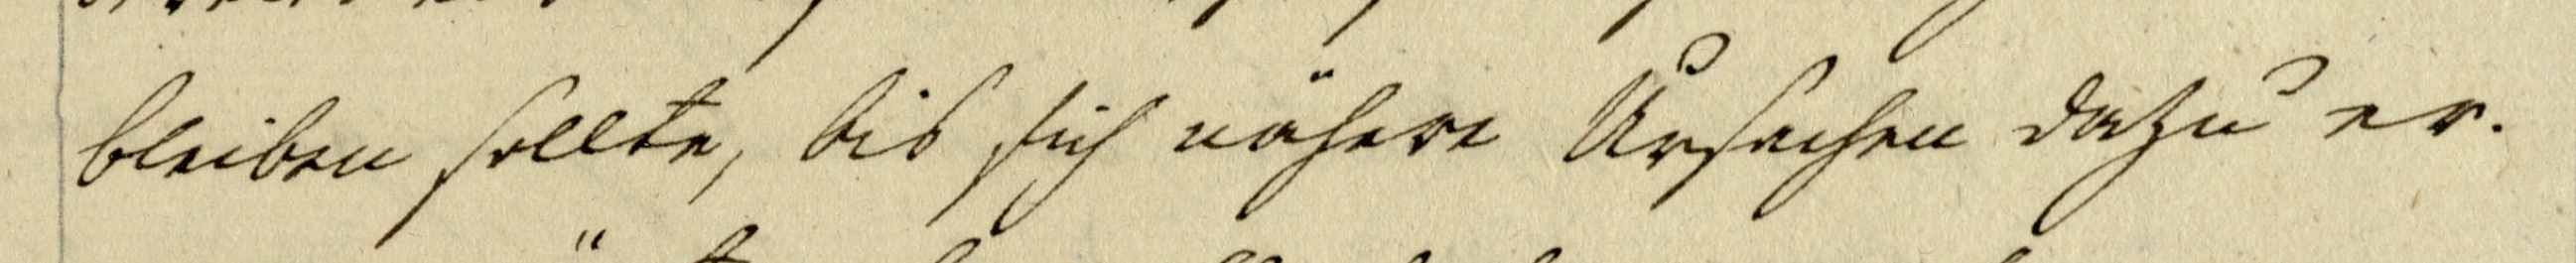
bleiben sollte, bis sich nähere Ursachen dazu er¬
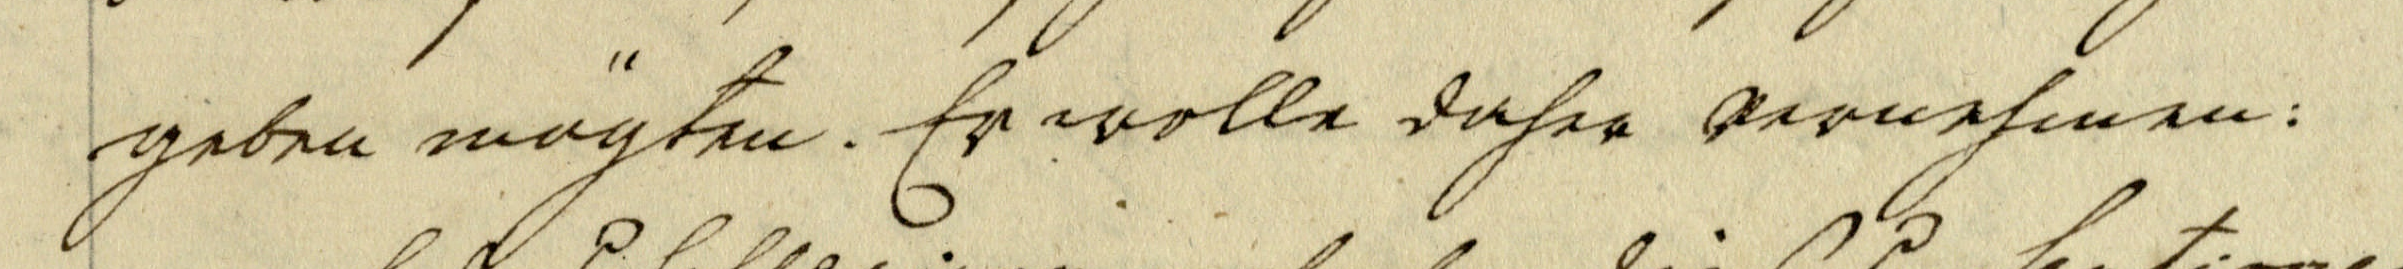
geben mögten. Er wolle daher vernehmen:
